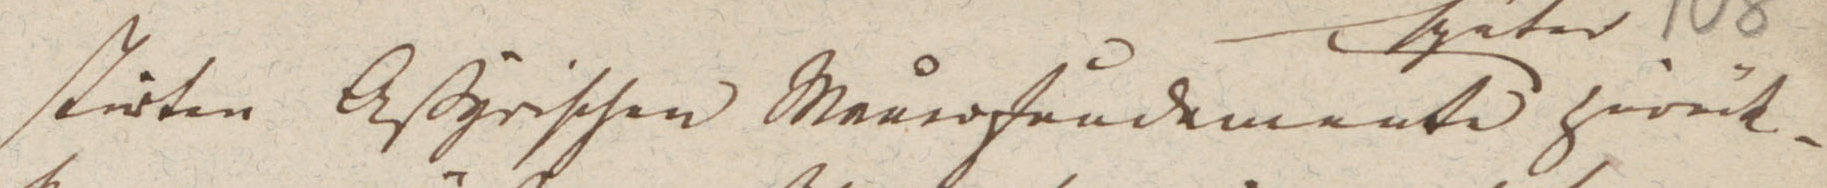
stirten Assyrischen Mauerfundamente später zurück-
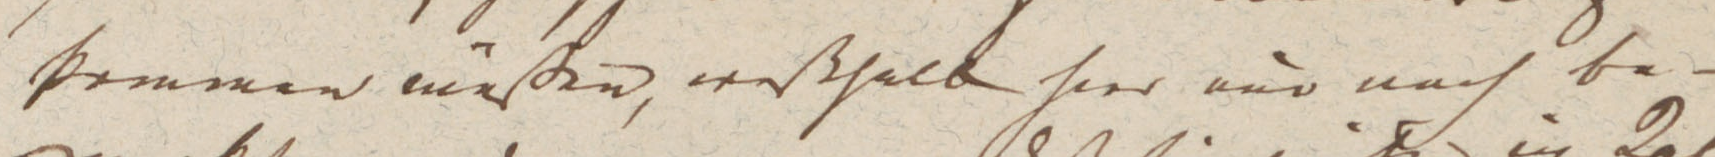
kommen müssen, wesshalb hier nur noch be-
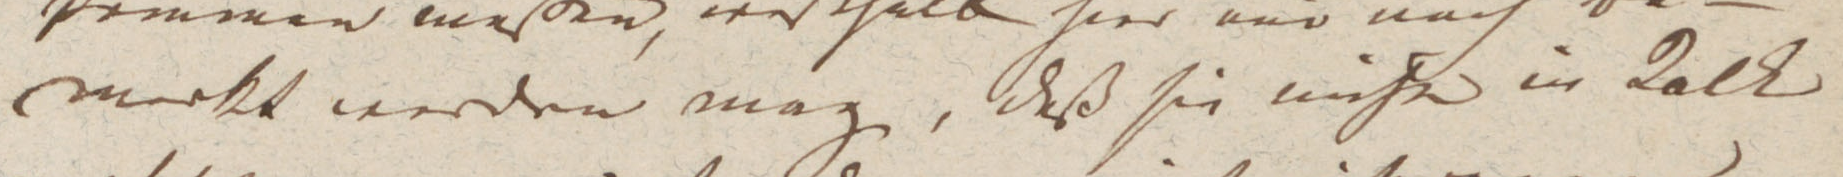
merkt werden mag, dass sie nicht in Kalk
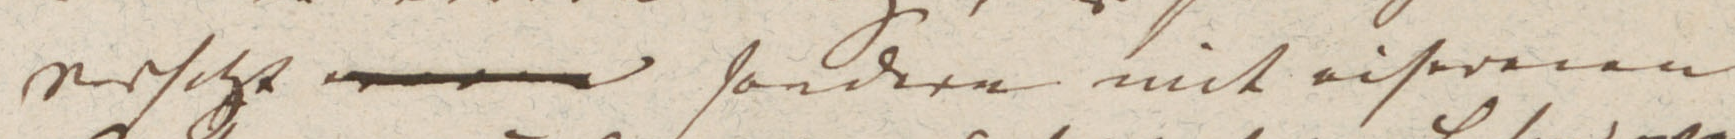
versetzt waren sondern mit eisernen
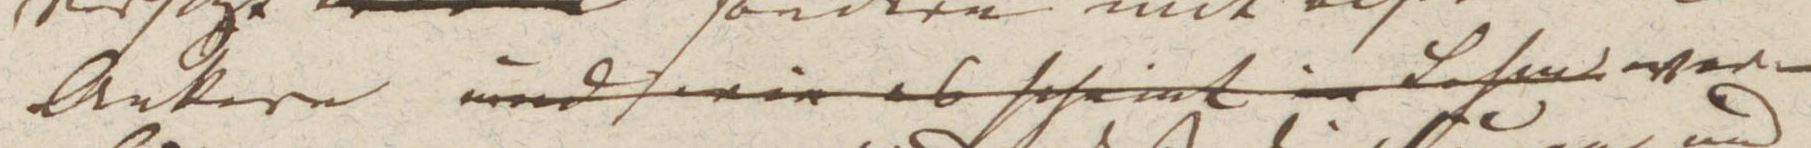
Ankern und wie es scheint in Lehm ver-
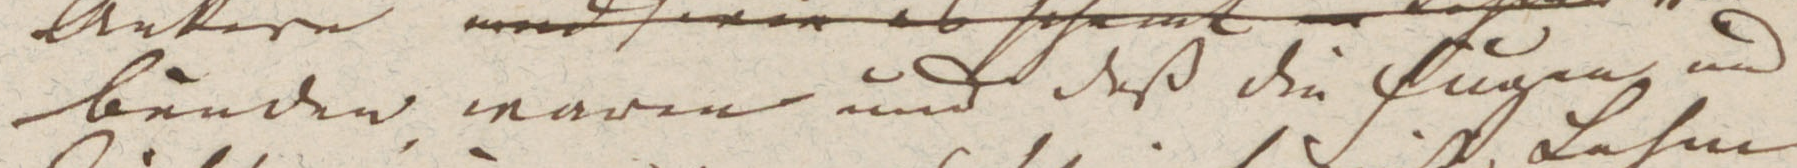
bunden waren und dass die Fugen und
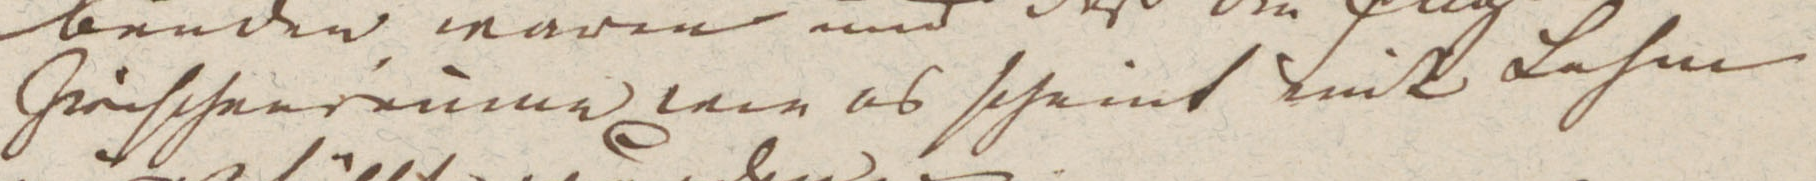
Zwischenräume wie es scheint mit Lehm
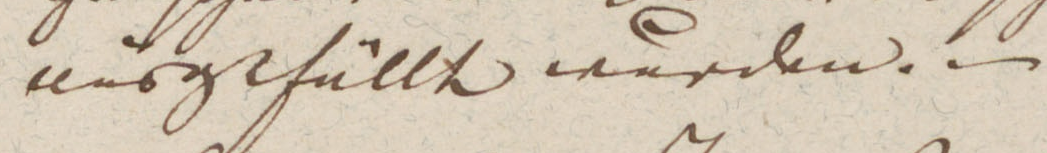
ausgefüllt wurden. – .
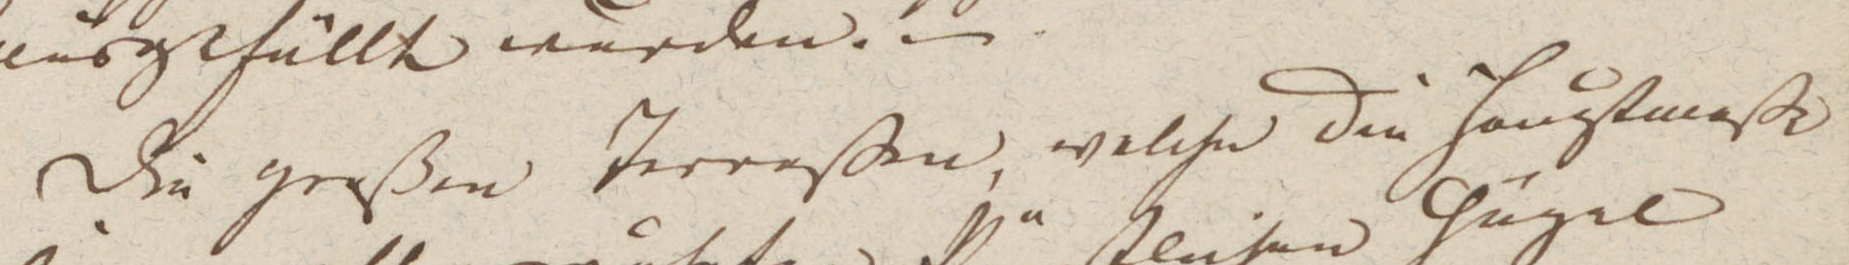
Die grossen Terrassen, welche die Hauptmasse
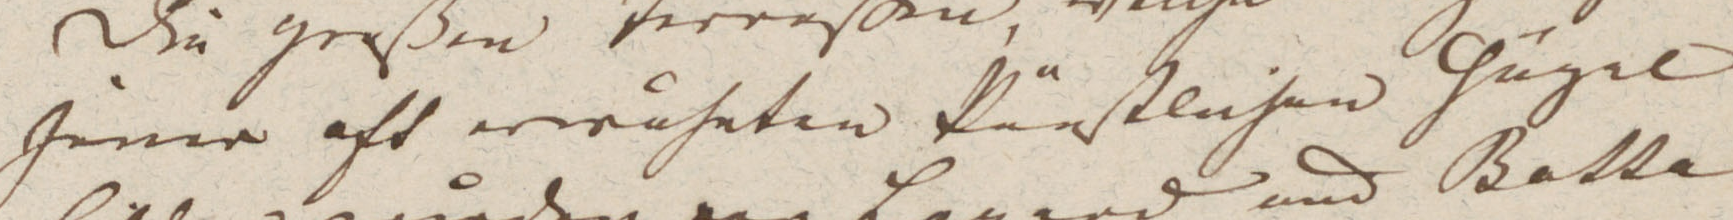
jener oft erwähnten künstlichen Hügel
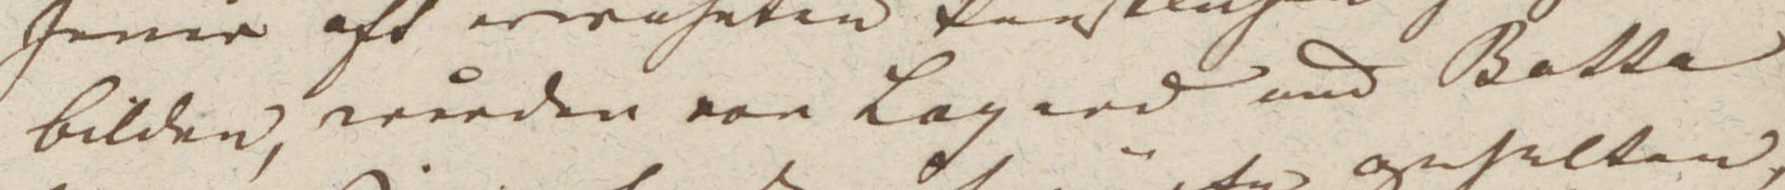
bilden, wurden von Layard und Botta
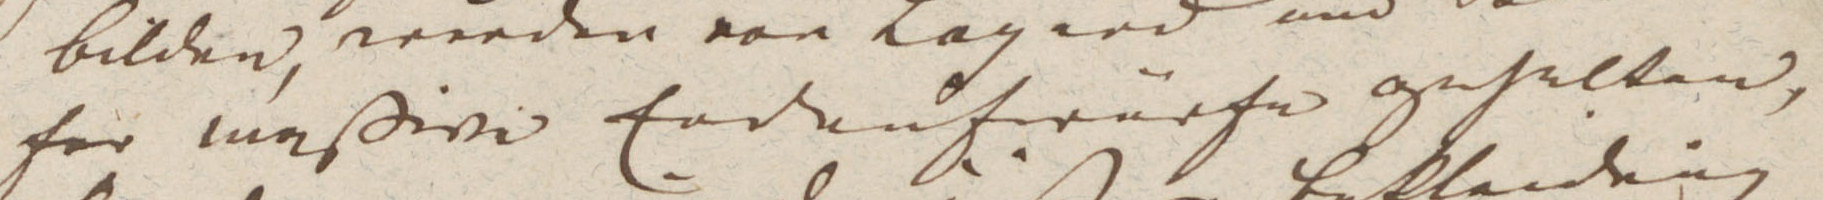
fur massive Erdaufwürfe gehalten,
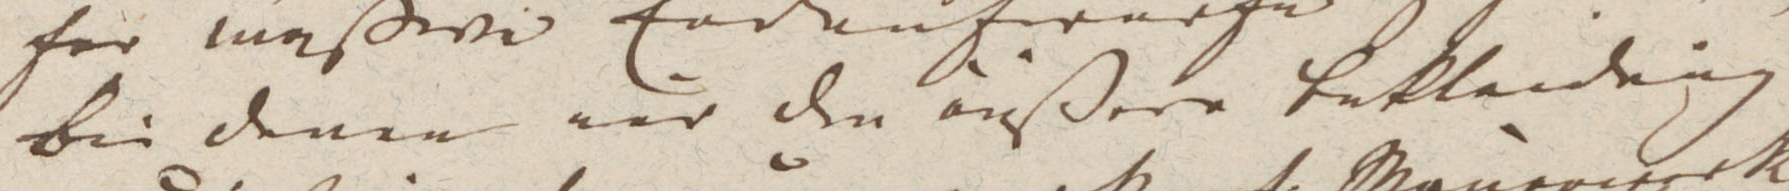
bei denen nur die äussere Bekleidung
